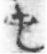屯
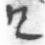九
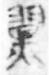翼
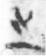之
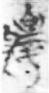○（翠）
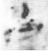白
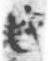○（毛）
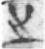之
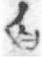首
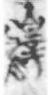○（翠）
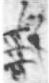○（頸）
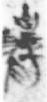○（翠）
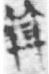篲
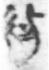紫
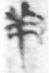羊
